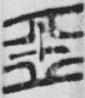亞（惡）
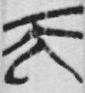而
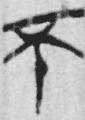不
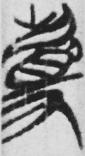○（憫）
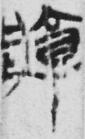牆
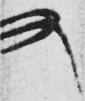又（有）
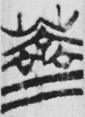薺（茨）
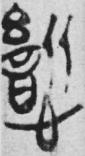○（慎）
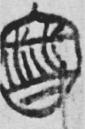○（密）
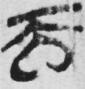而
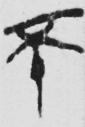不
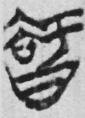智（知）
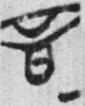言
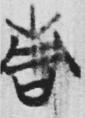青
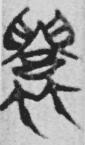○（蠅）
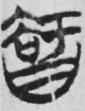智（知）
